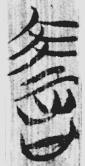○（顏）
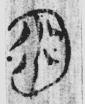囦（淵）
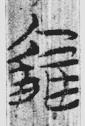{尒䎽}（問）
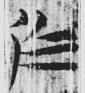於
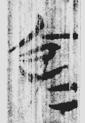孔子
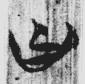曰
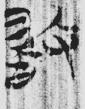敢（敢）
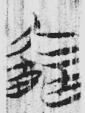{尒䎽}（問）
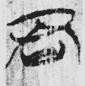君
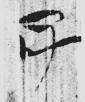子
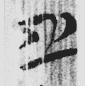之
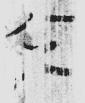內（入）
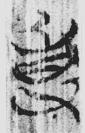事（仕）
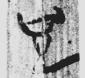也
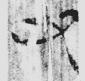又（有）
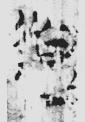道
